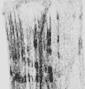貞？
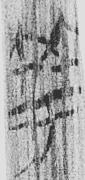竽
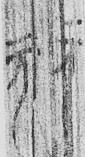瑟
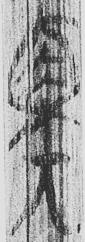衡
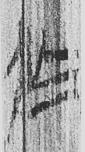於
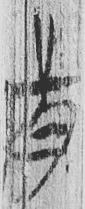前
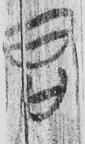君
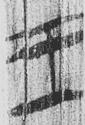王
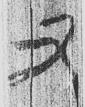又（有）
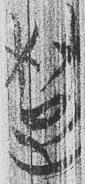楚
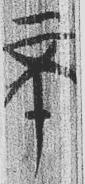不
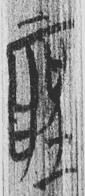聖（聽）
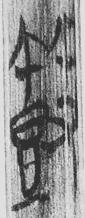鼓
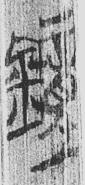鐘
